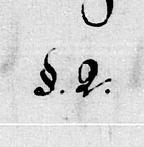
§. 2.
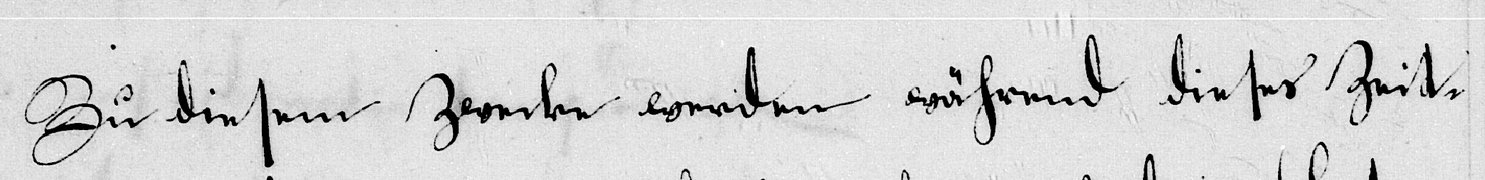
Zu diesem Zwecke werden während dieses Zeit¬
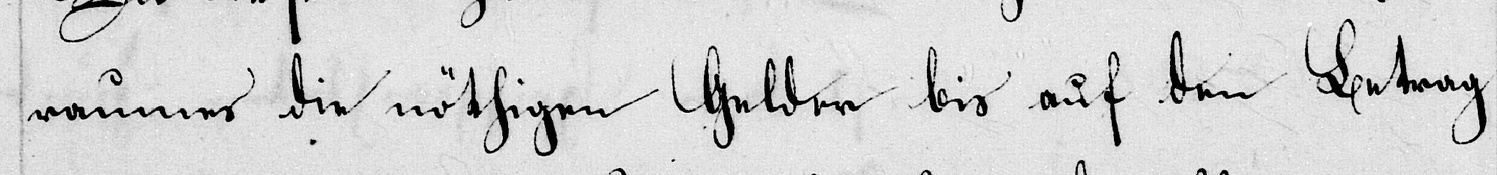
raumes die nöthigen Gelder bis auf den Betrag
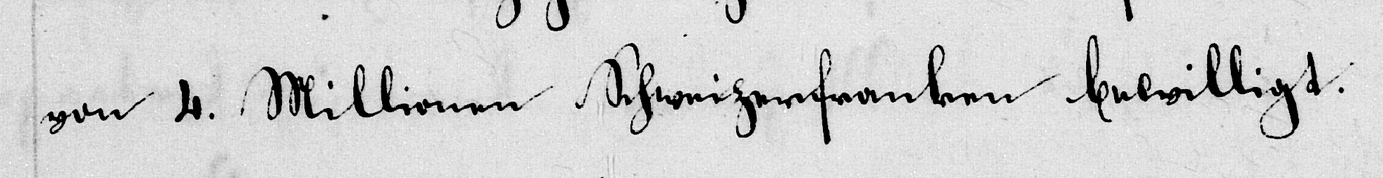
von 4. Millionen Schweizerfranken bewilligt.
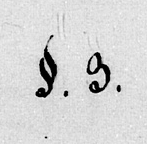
§. 3.
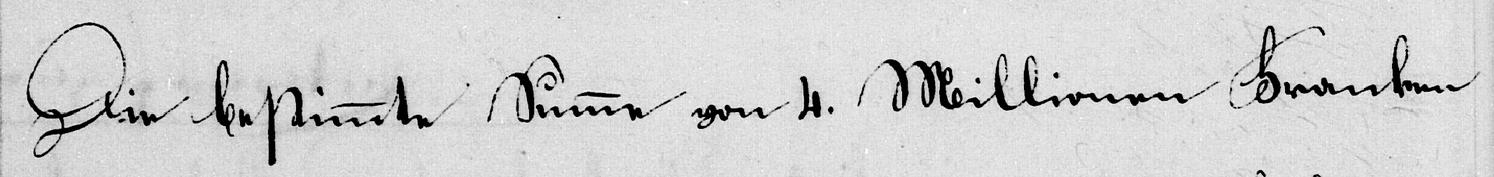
Die bestimmte Summe von 4. Millionen Franken
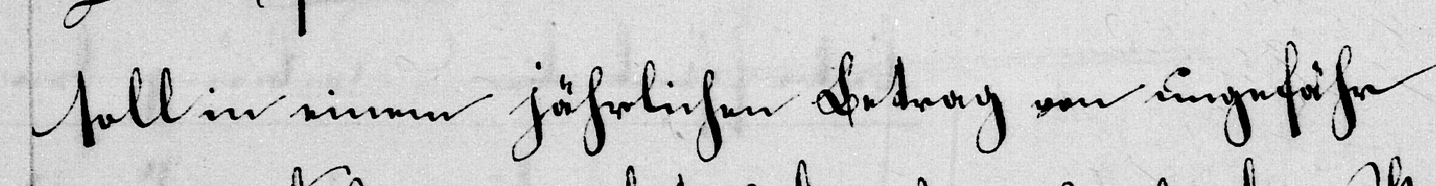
soll in einem jährlichen Betrag von ungefähr
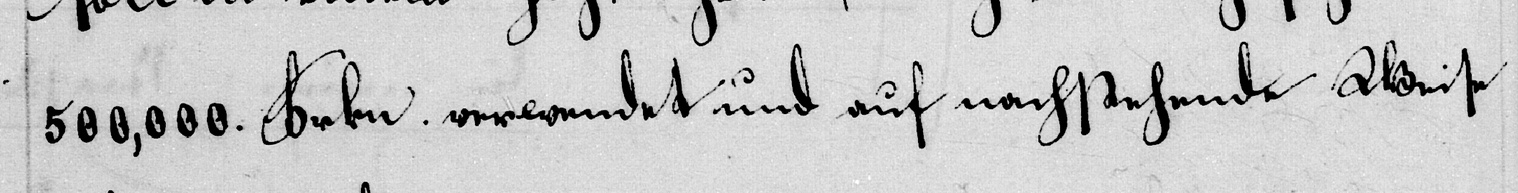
500,000. Frkn. verwendet und auf nachstehende Weise
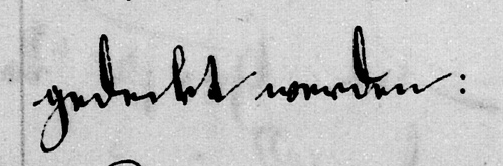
gedeckt werden:
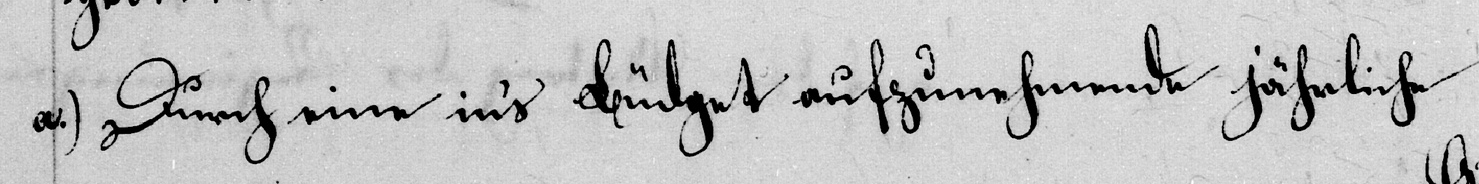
a.) Durch eine in’s Büdget aufzunehmende jährliche
